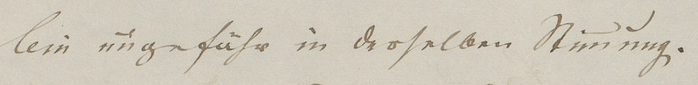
bin ungefähr in derselben Stimmung.
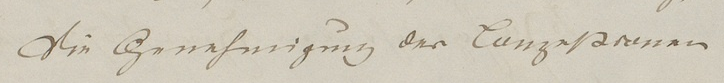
Die Genehmigung der Conzessionen
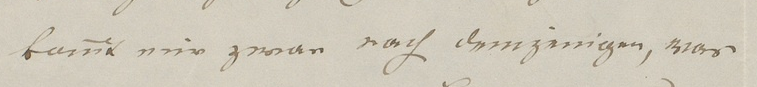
kommt mir zwar nach demjenigen, was
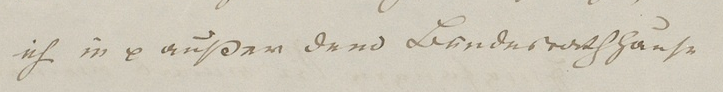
ich in & außer dem Bundesrathhause
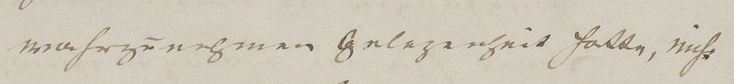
wahrzunehmen Gelegenheit hatte, nicht
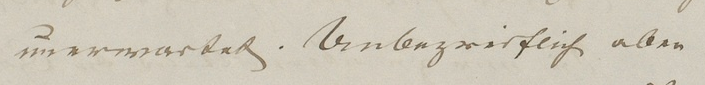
unerwartet. Unbegreiflich aber
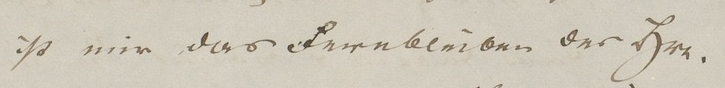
ist mir das Fernbleiben des Hrn.
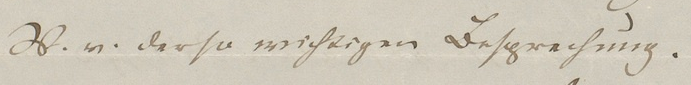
W. v. der so wichtigen Besprechung.
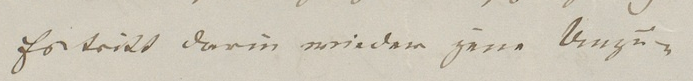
Es tritt darin wieder jene Unzu-
